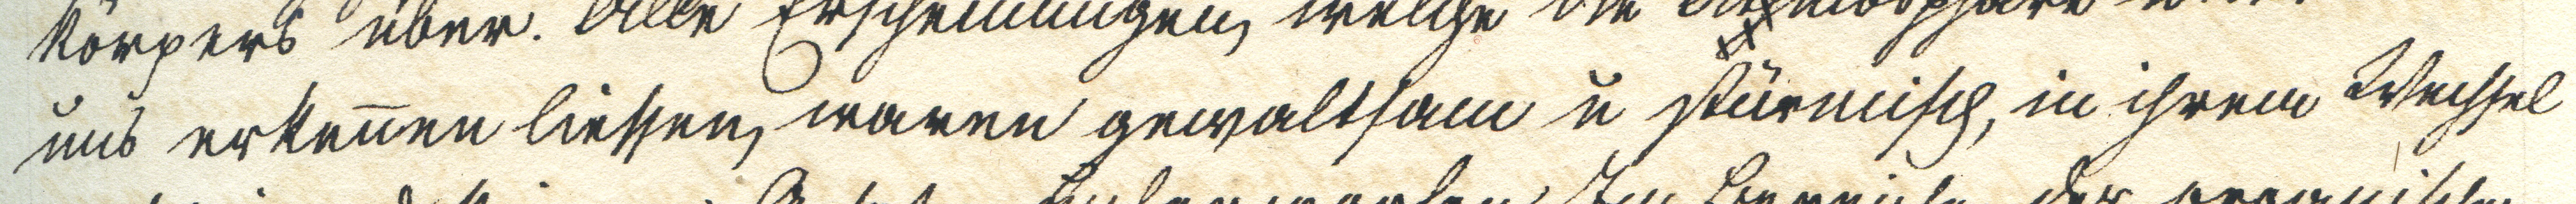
uns erkeñen liessen, waren gewaltsam u stürmisch, in ihrem Wechsel
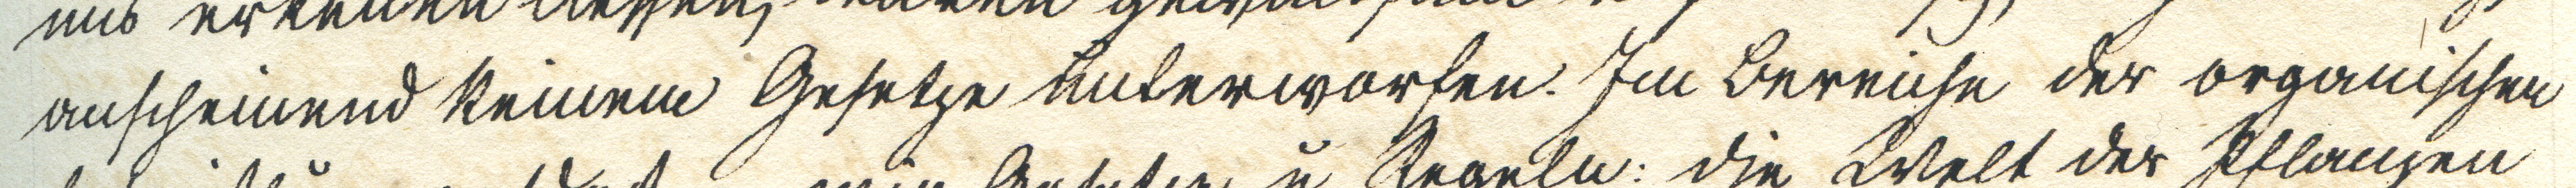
anscheinend keinem Gesetze unterworfen. Im Bereiche der organischen
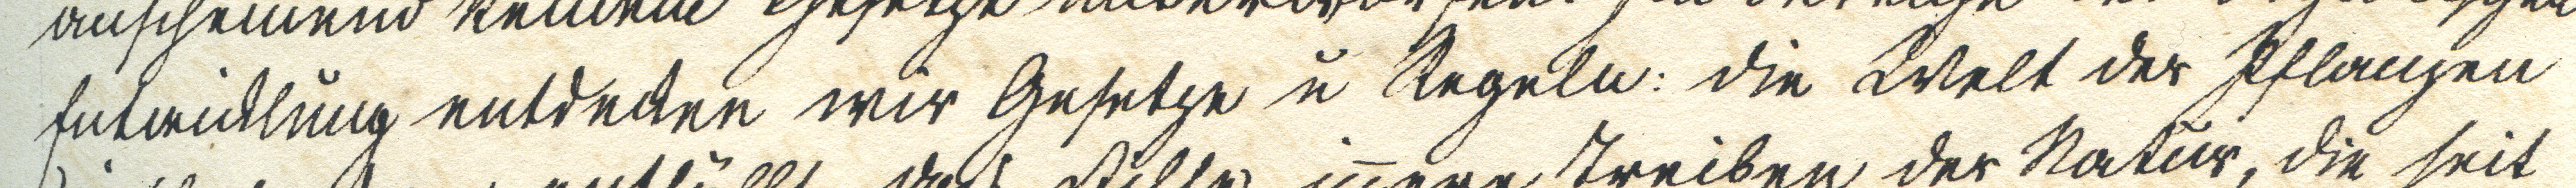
Entwicklung entdecken wir Gesetze u Regeln: die Welt der Pflanzen
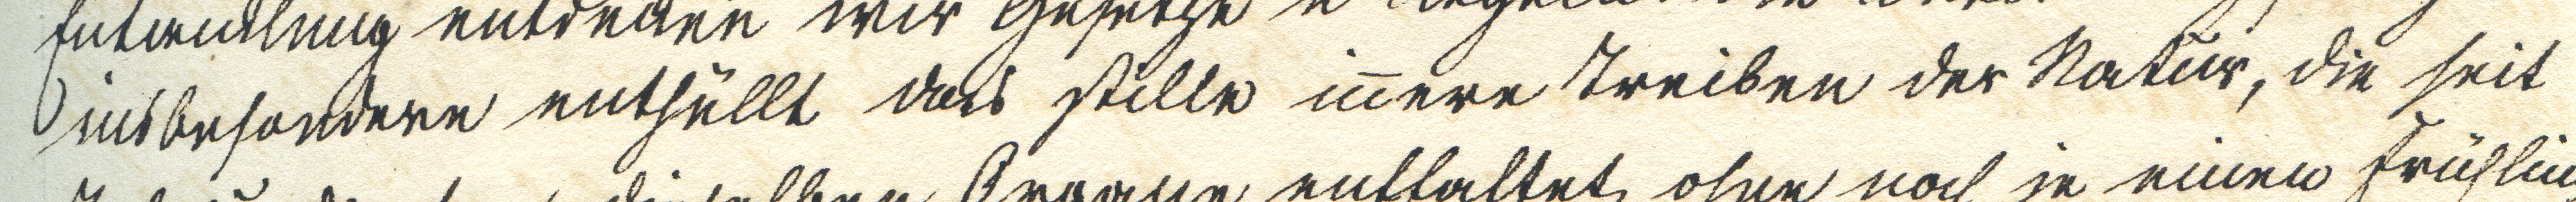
insbesondere enthüllt das stille iñere Treiben der Natur, die seit
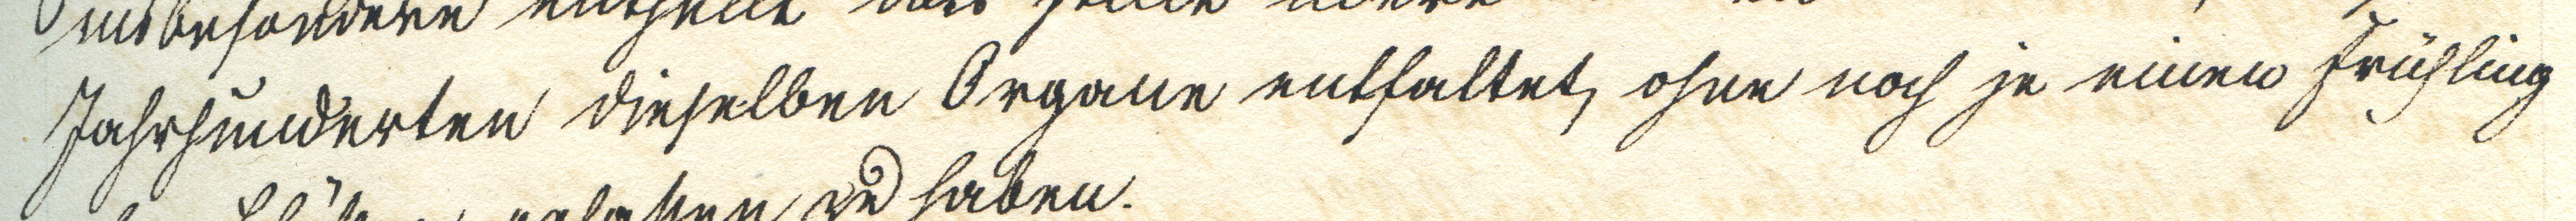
Jahrhunderten dieselben Organe entfaltet, ohne noch je einen Frühling
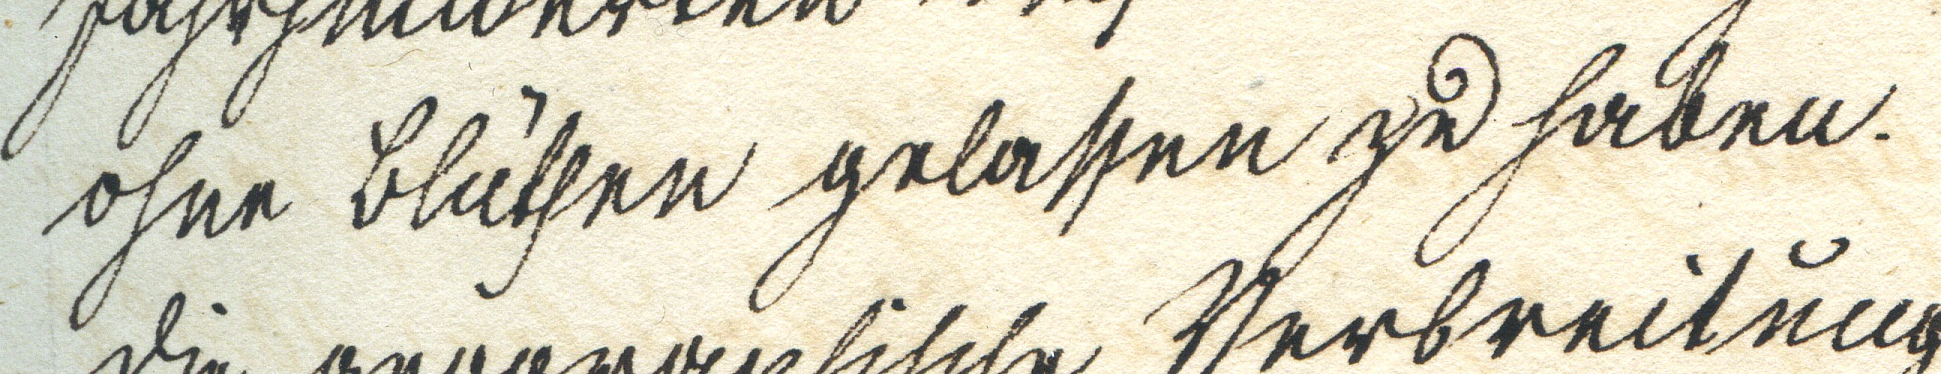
ohne Blüthen gelassen zu haben.
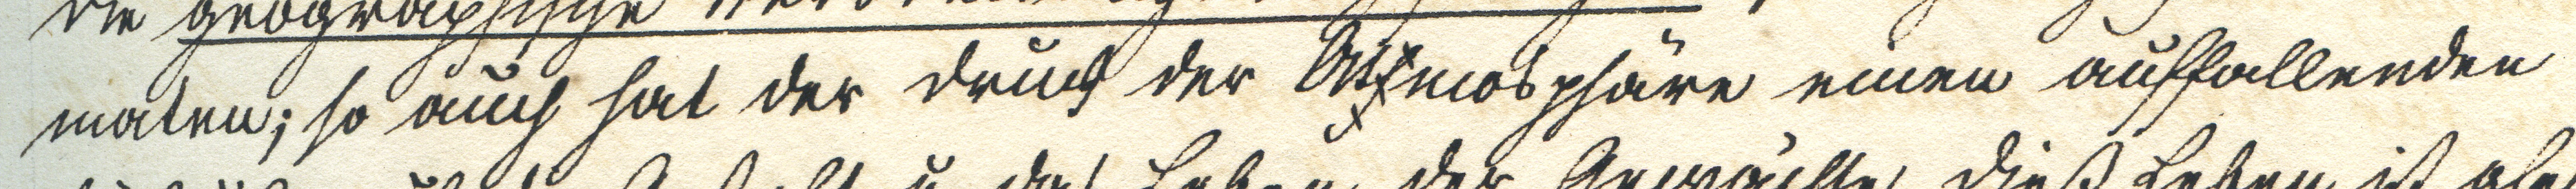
maten; so auch hat der Druck der Athmosphäre einen auffallenden
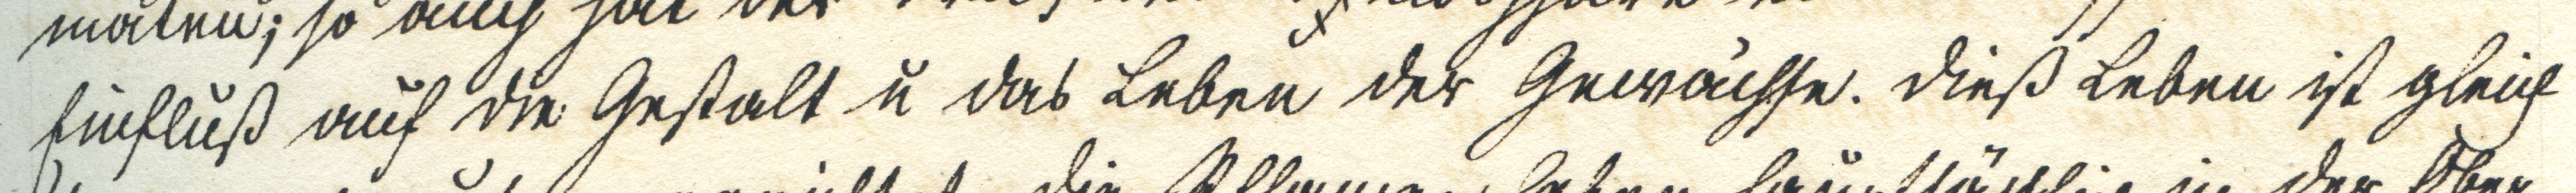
Einfluß auf die Gestalt u das Leben der Gewächse. Dieß Leben ist gleich-
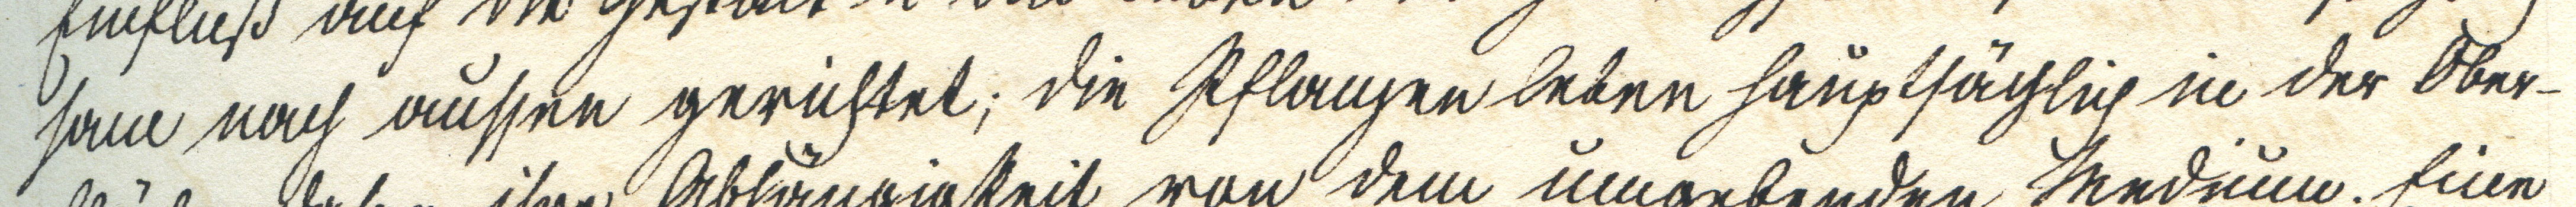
sam nach aussen gerichtet; die Pflanzen leben hauptsächlich in der Ober-
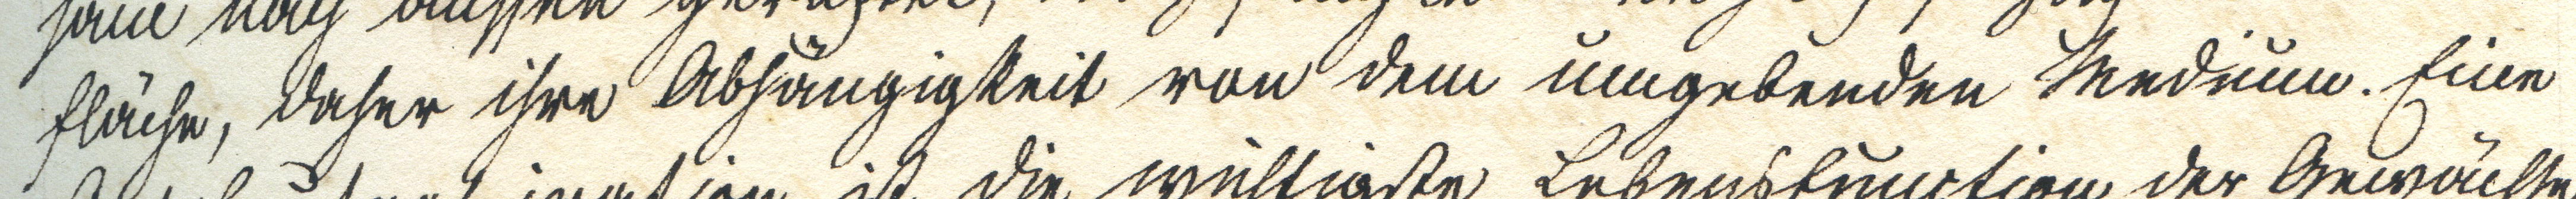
fläche, daher ihre Abhängigkeit von dem umgebenden Medium. Eine
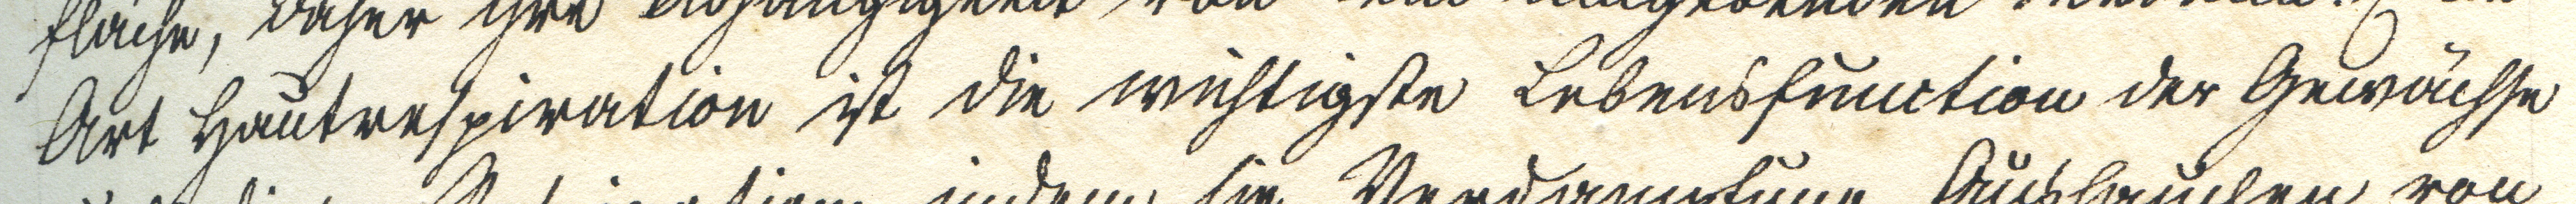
Art Hautrespiration ist die wichtigste Lebensfunction der Gewächse
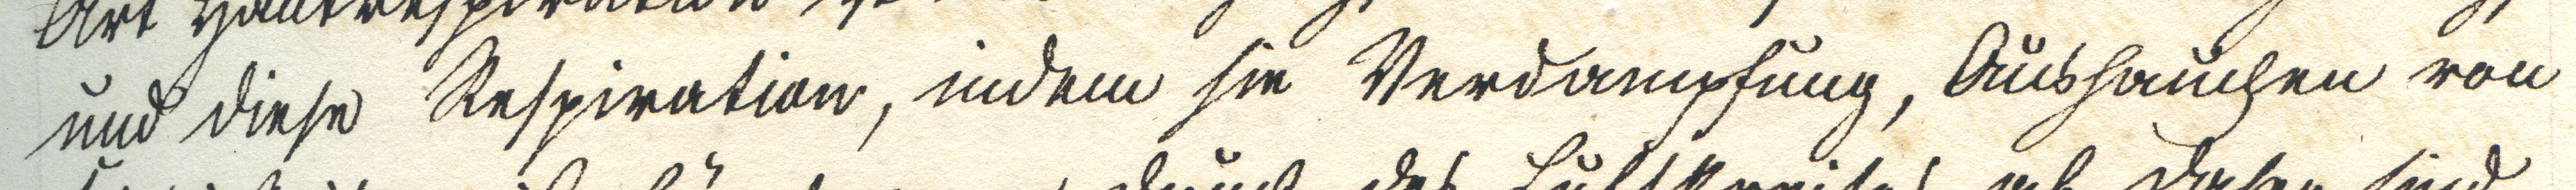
und diese Respiration, indem sie Verdampfung, Aushauchen von
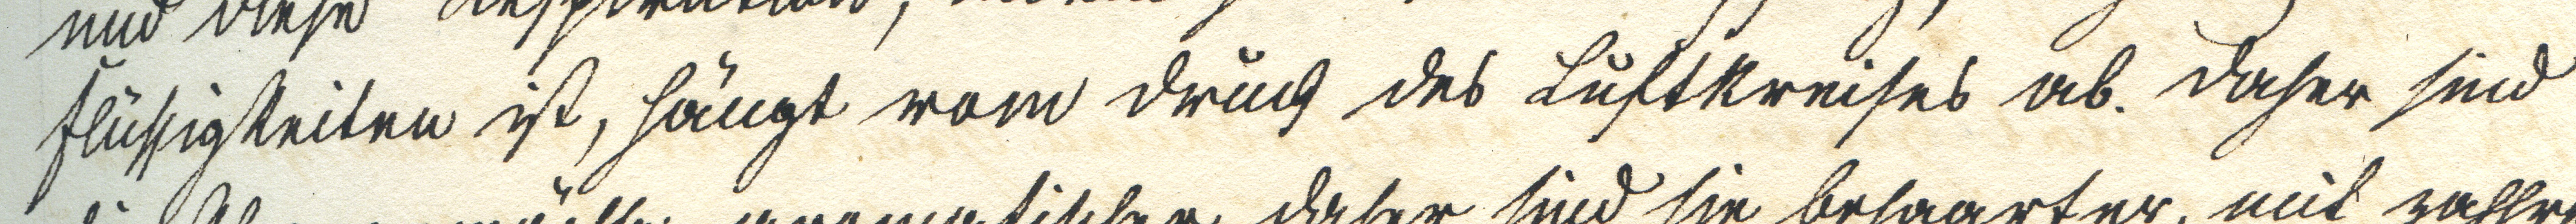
Flüssigkeiten ist, hängt vom Druck des Luftkreises ab. Daher sind
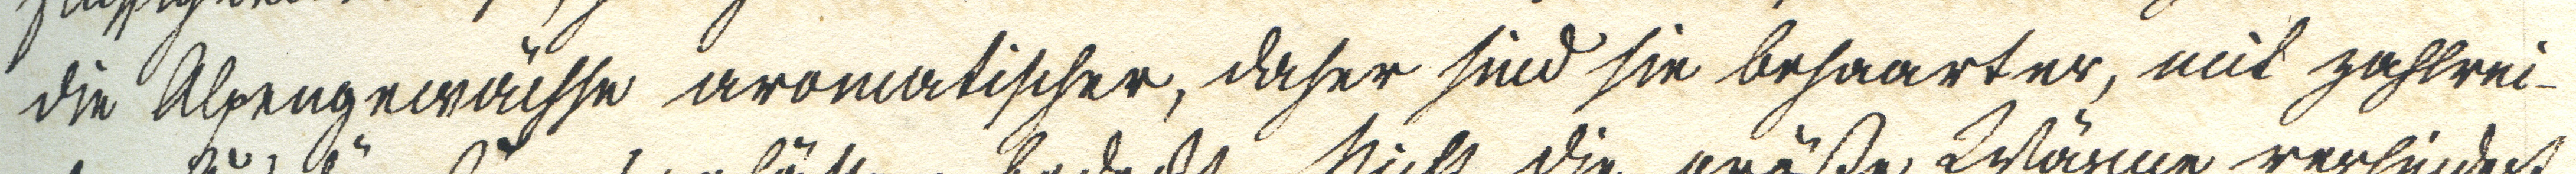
die Alpengewächse aromatischer, daher sind sie behaarter, mit zahlrei-
